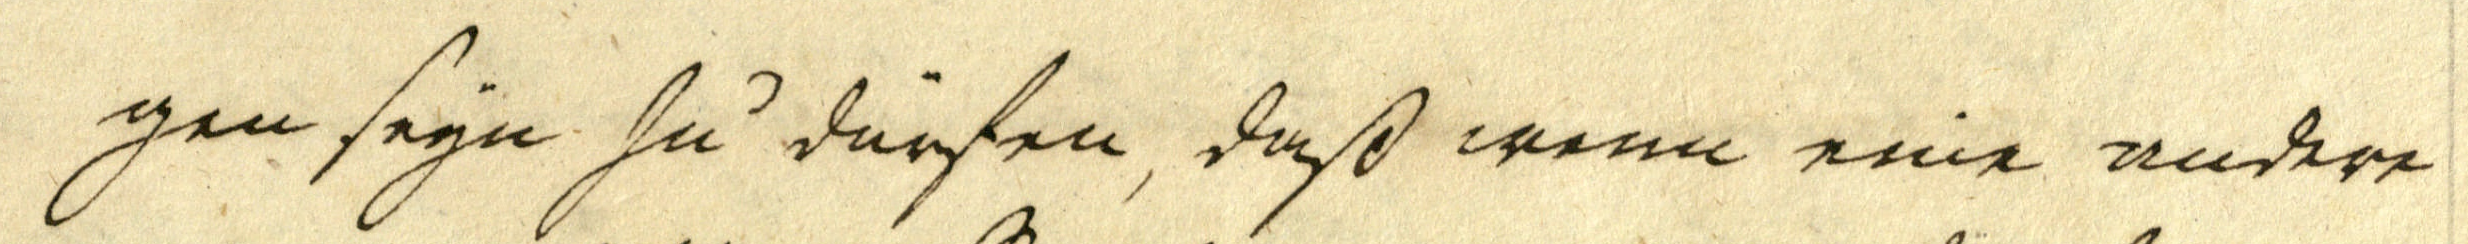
gen seÿn zu dürfen, daß wenn eine andere
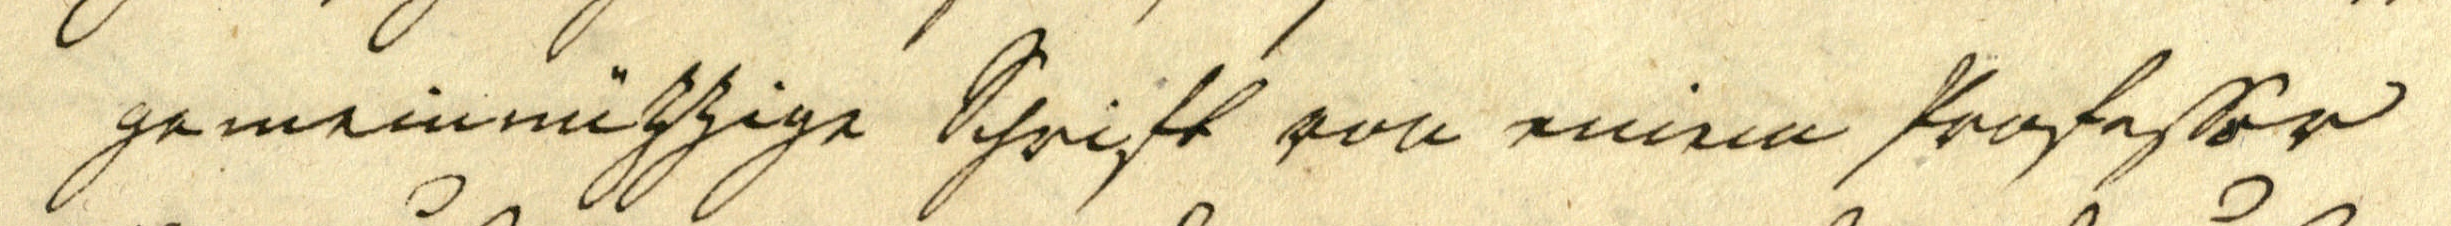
gemeinnüzzige Schrift von einem Professor
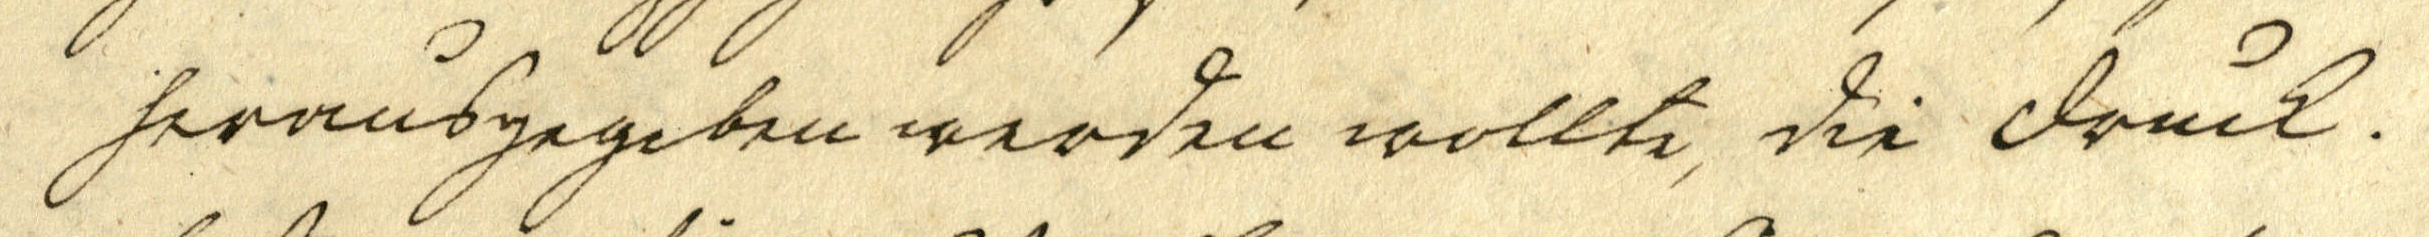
herausgegeben werden wollte, die Druck¬
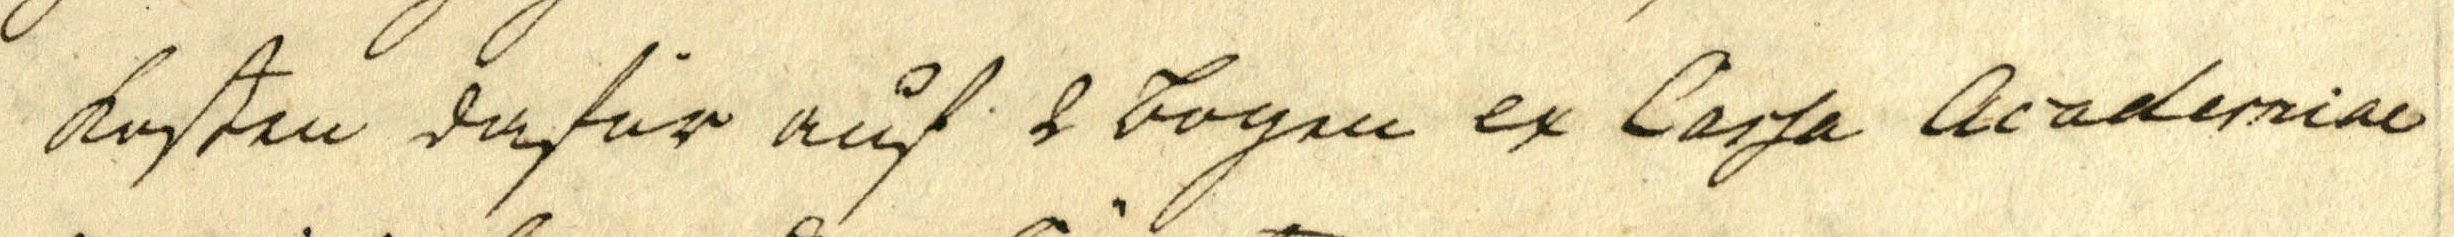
Kosten dafür auf 2 Bogen ex Cassa Academiae
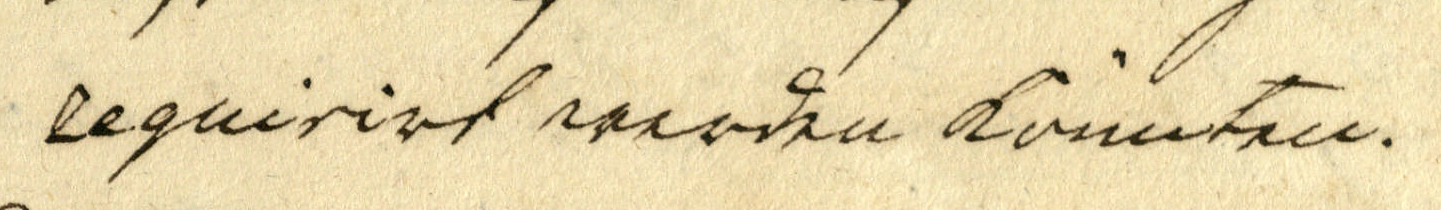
requiriret werden könnten.
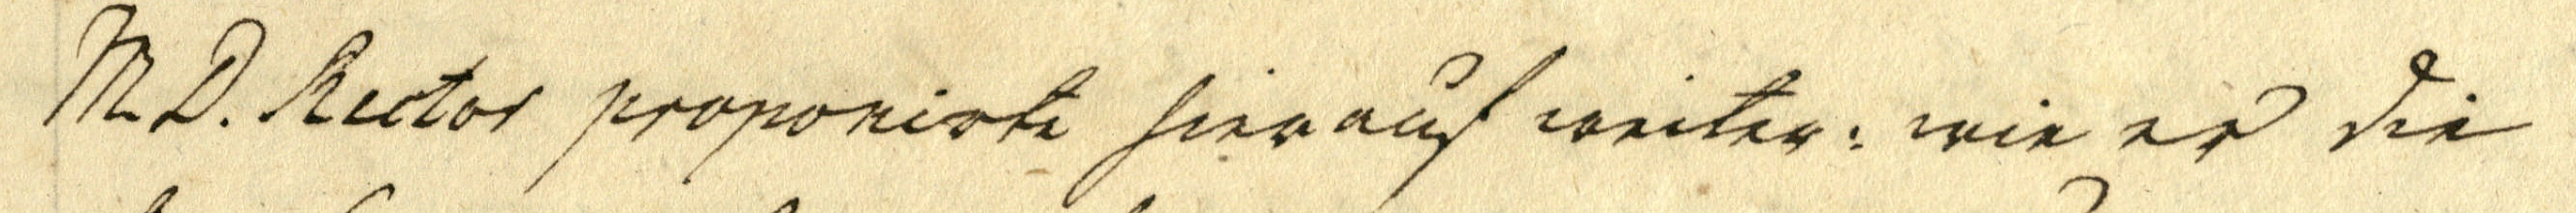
M. D . Rector proponirte hierauf weiter : wie er die
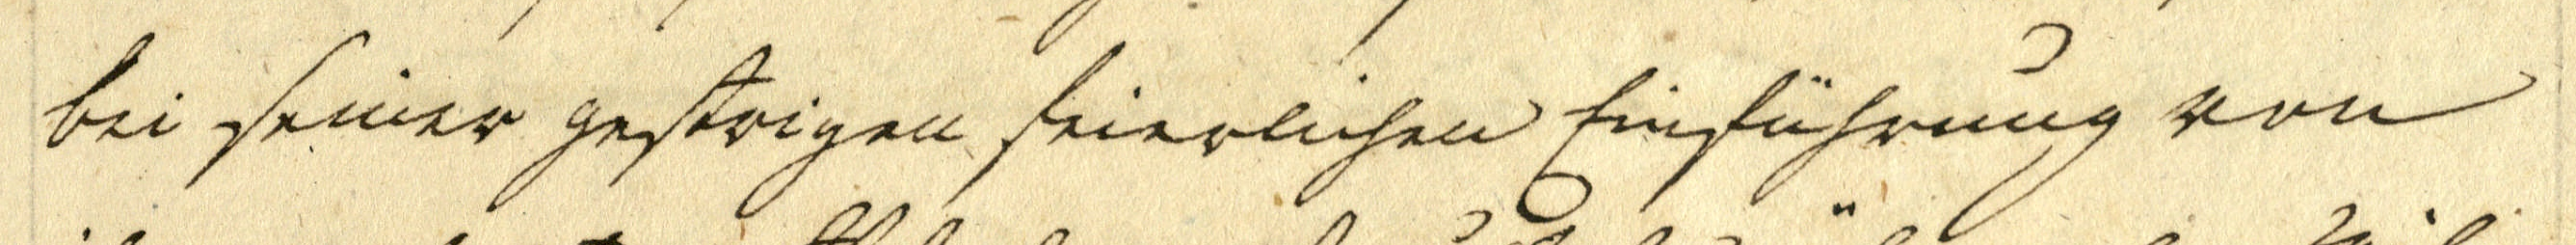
bei seiner gestrigen feierlichen Einführung von
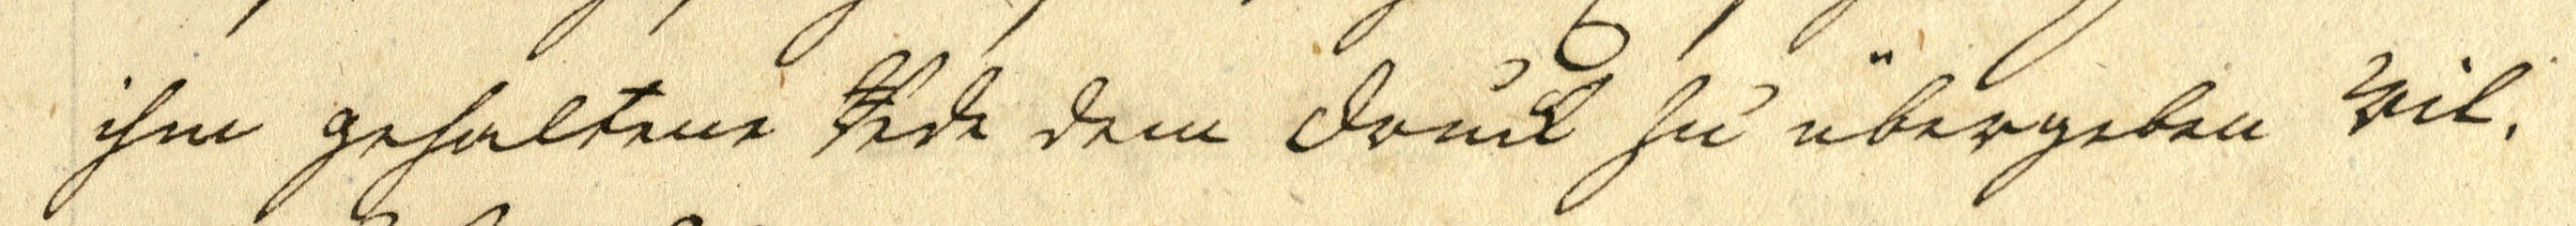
ihm gehaltene Rede dem Druck zu übergeben Wil¬
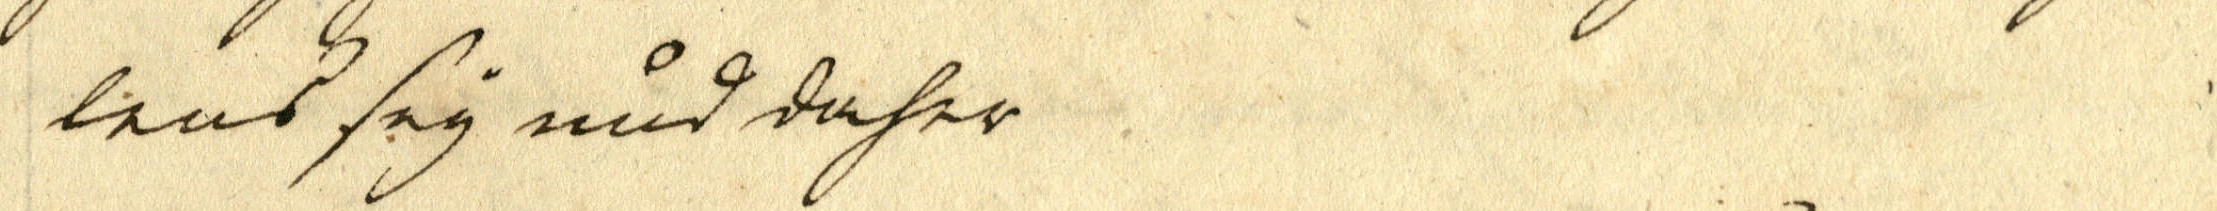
lens seÿ und daher
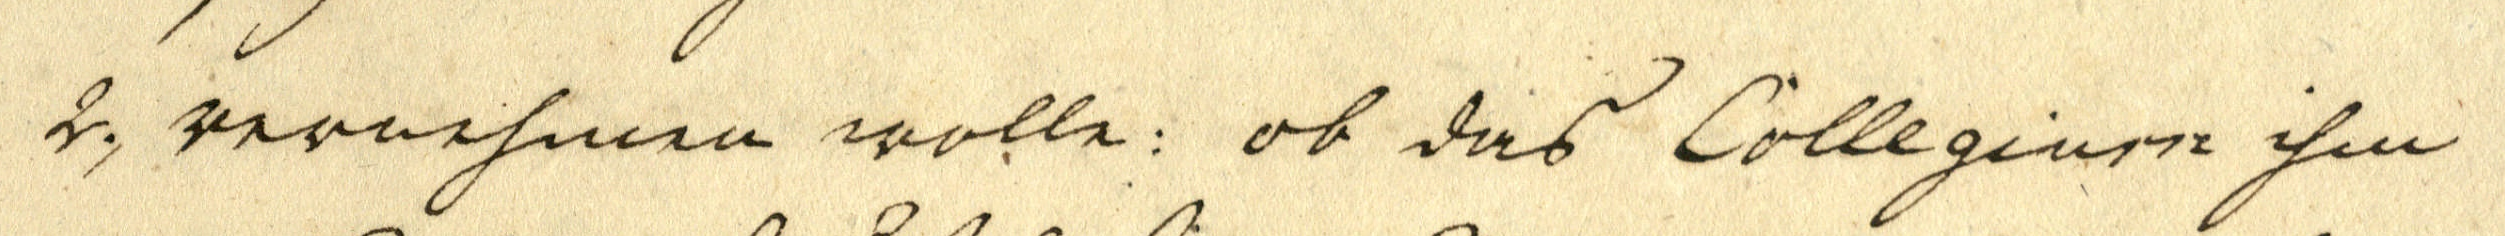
2 . vernehmen wolle: ob das Collegium ihm
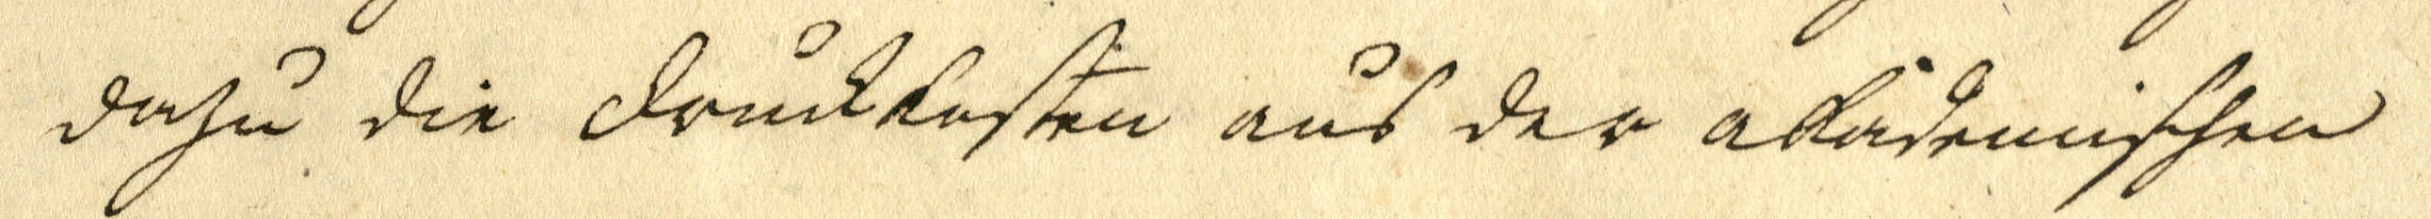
dazu die Druckkosten aus der akademischen
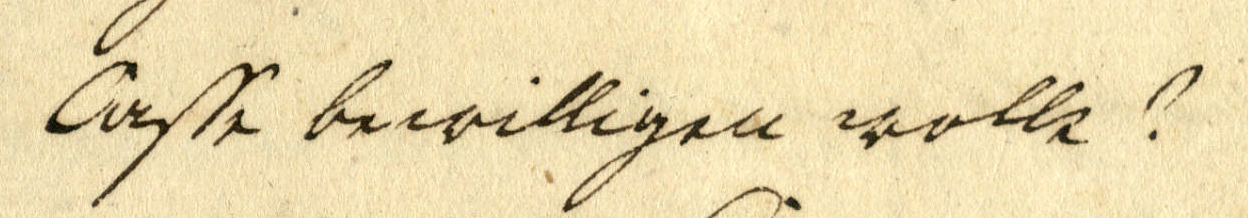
Casse bewilligen wolle?
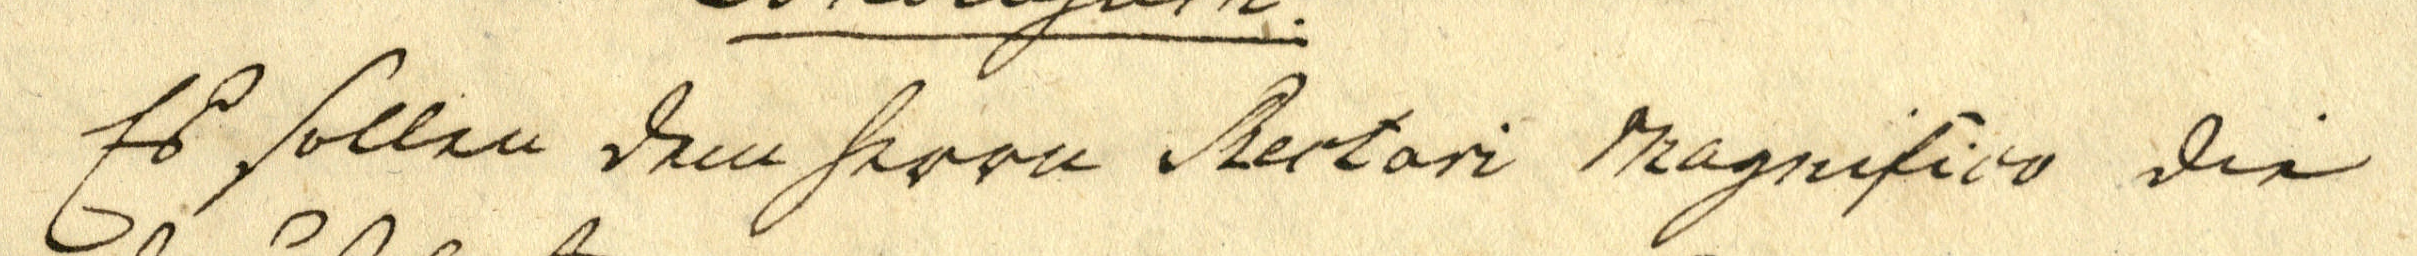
Es sollen dem herrn Rectori Magnifico die
